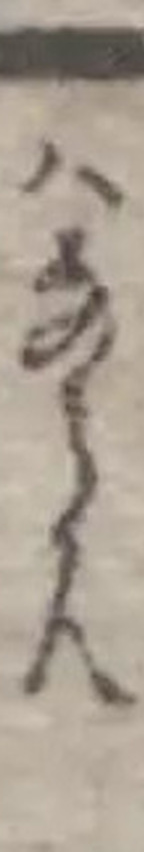はならん
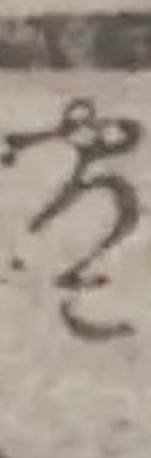やつと
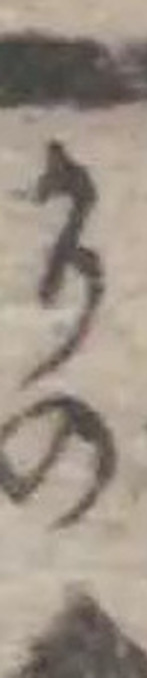かりの
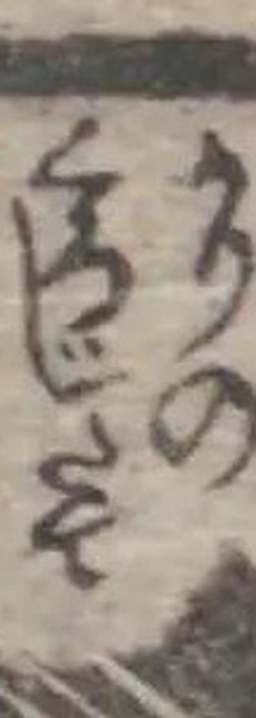くろじたて
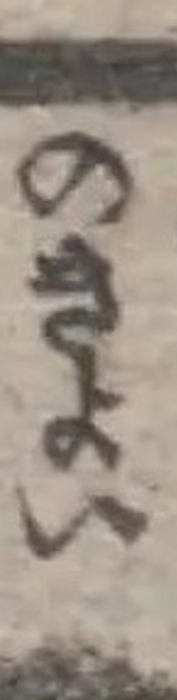のきよい
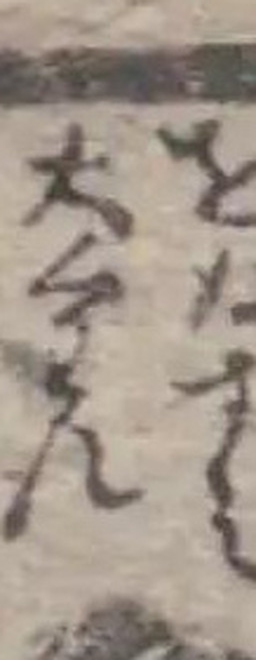大くわん
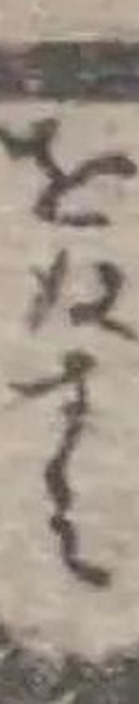をぬすみ
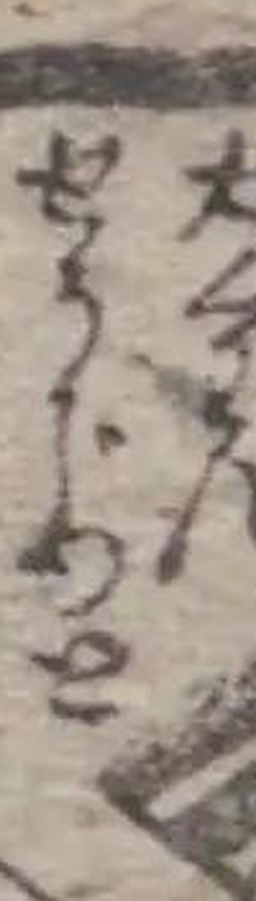せうじゆと
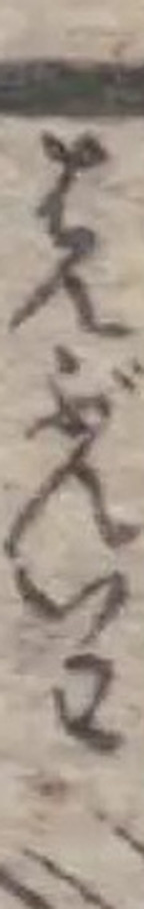はんぶんいわ
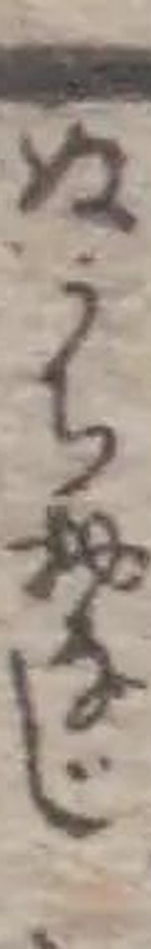ぬうちおなじ
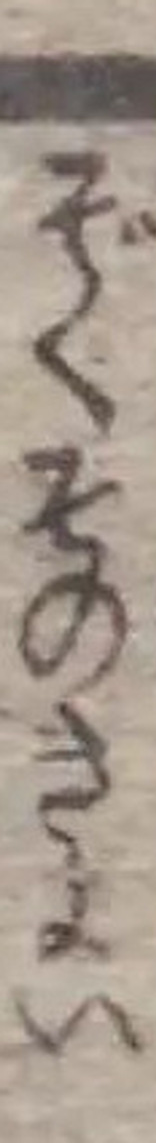ぞくそのきよい
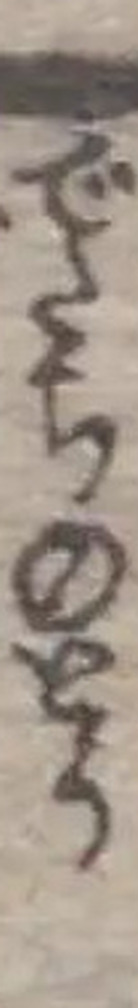でたちのとう
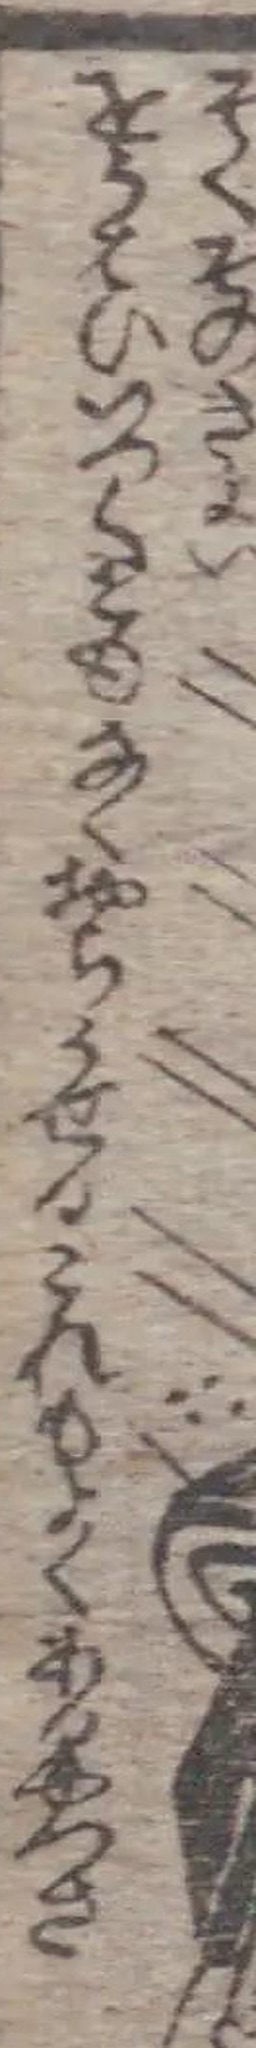をうはひいつくともなくおちうせるこれもよくあるやつさ

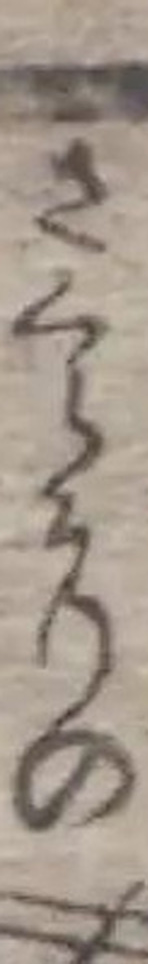さくらかりの
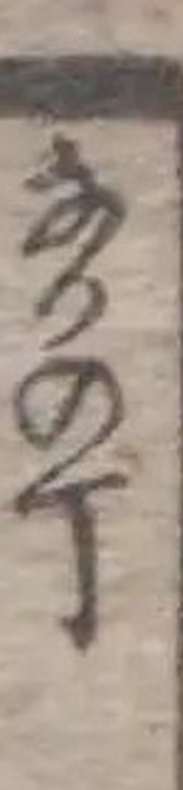なかの丁
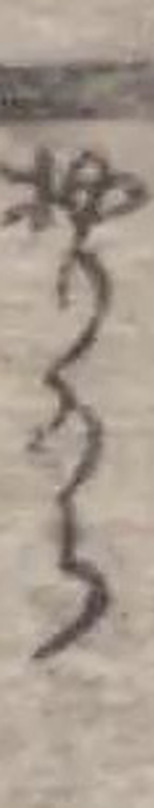おりから
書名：富多高慢噺 3巻
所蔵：国立国会図書館 National Diet Library, JAPAN
